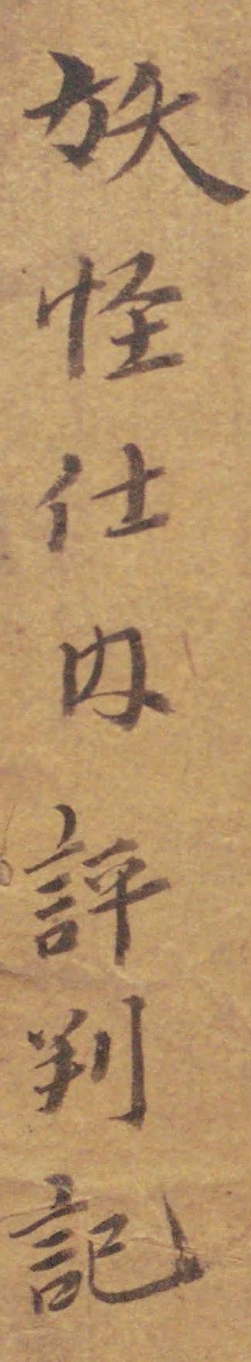妖怪仕打評判記

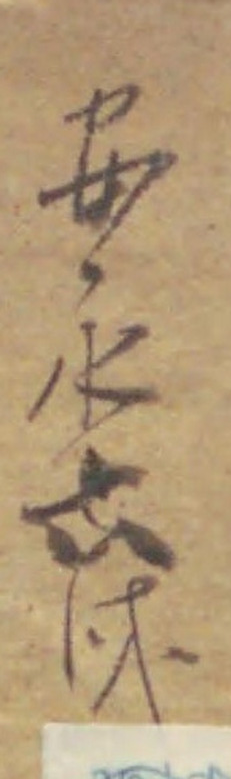安永六戌

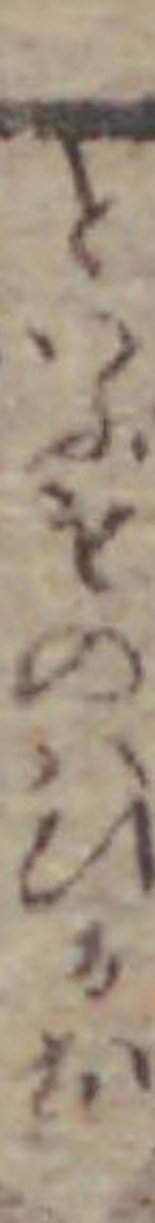といふものはひる出
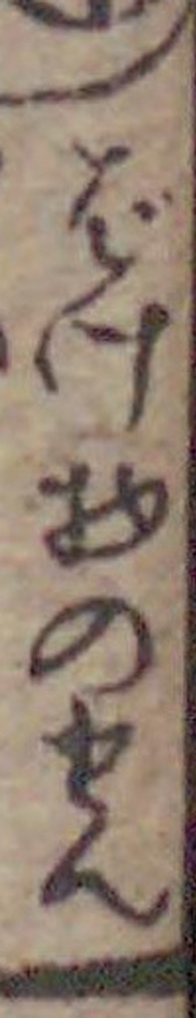ばけ物のせん
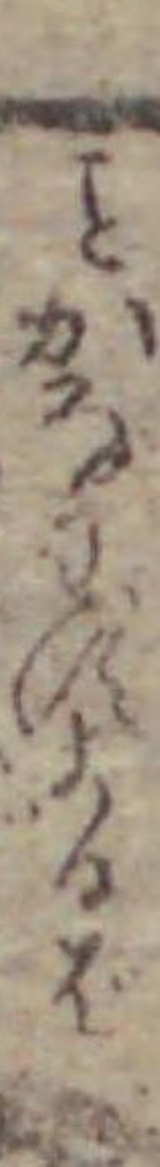ことかなわすよるば
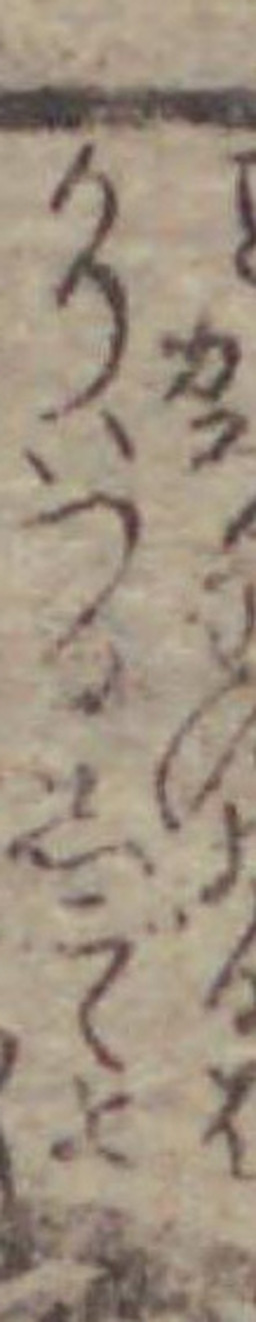かりいつるしごくよ
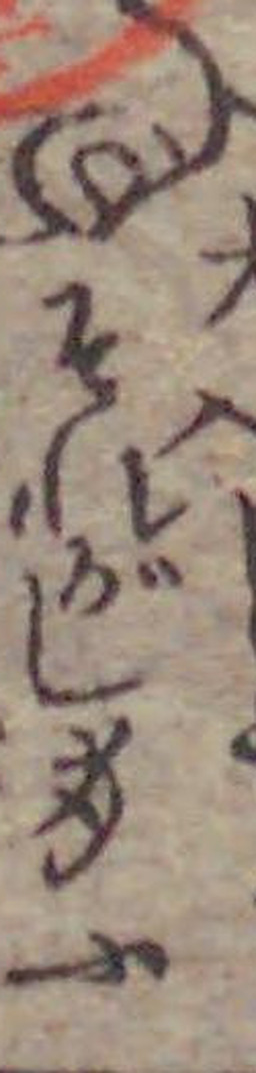それがし身ふ
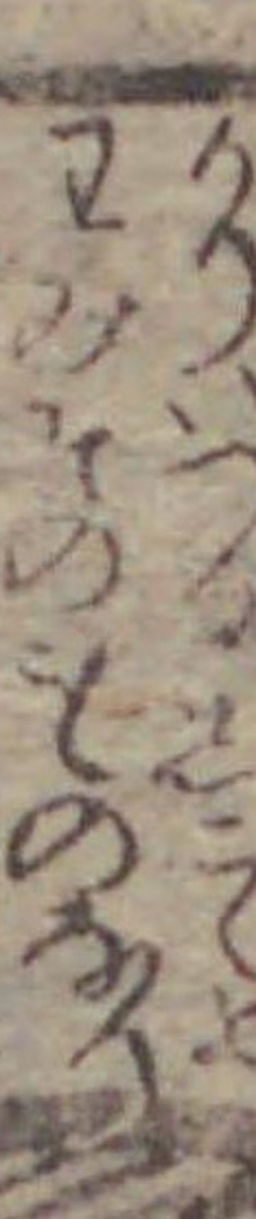わみそのものなり
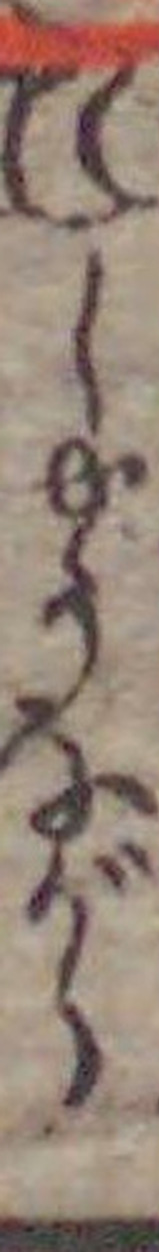しやうながら
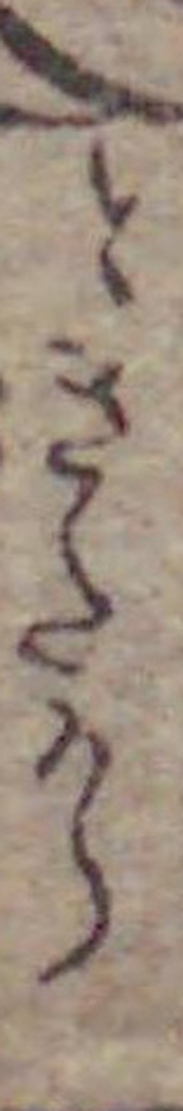ときたから
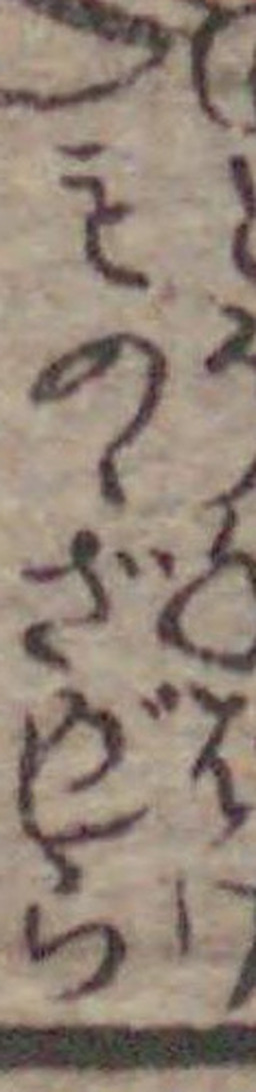ものゝざがしら
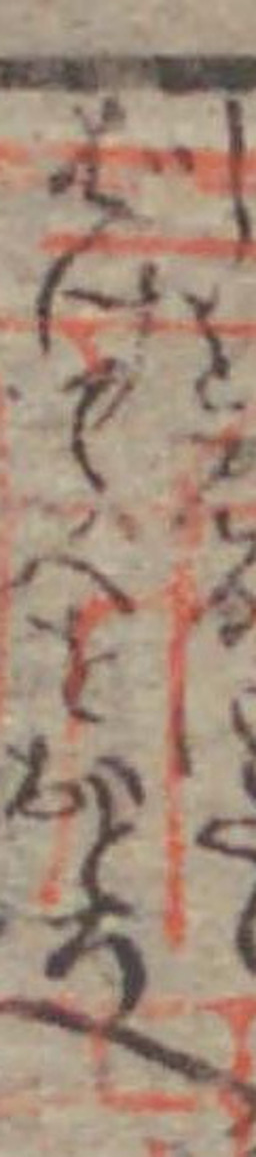ばけて人をおとろ
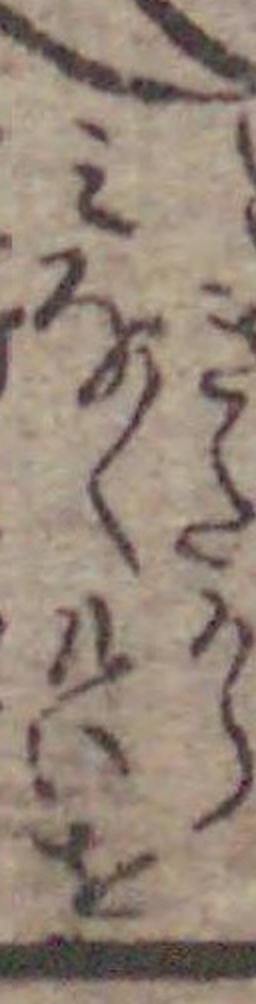みな〳〵けいを
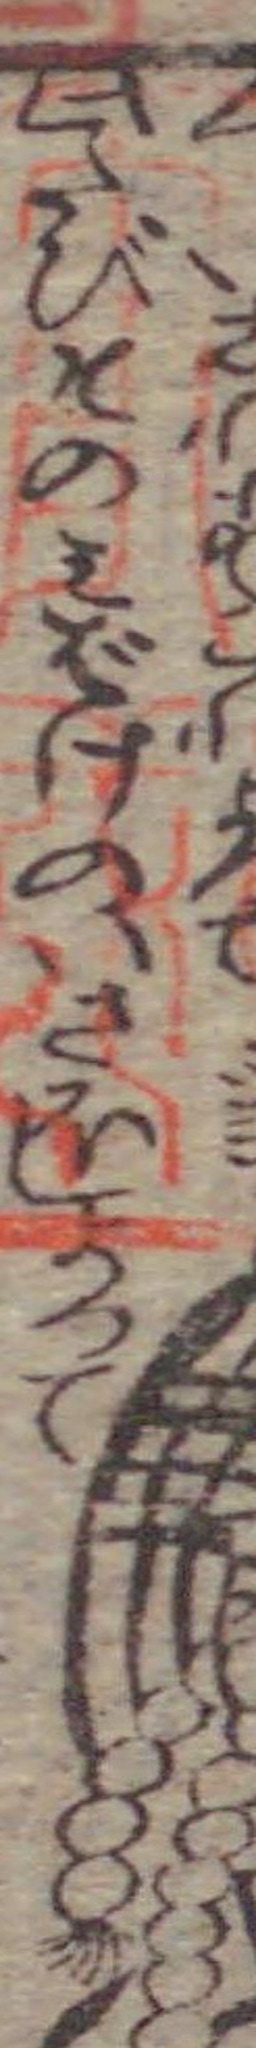此たびそのみばけのいさほしよつて
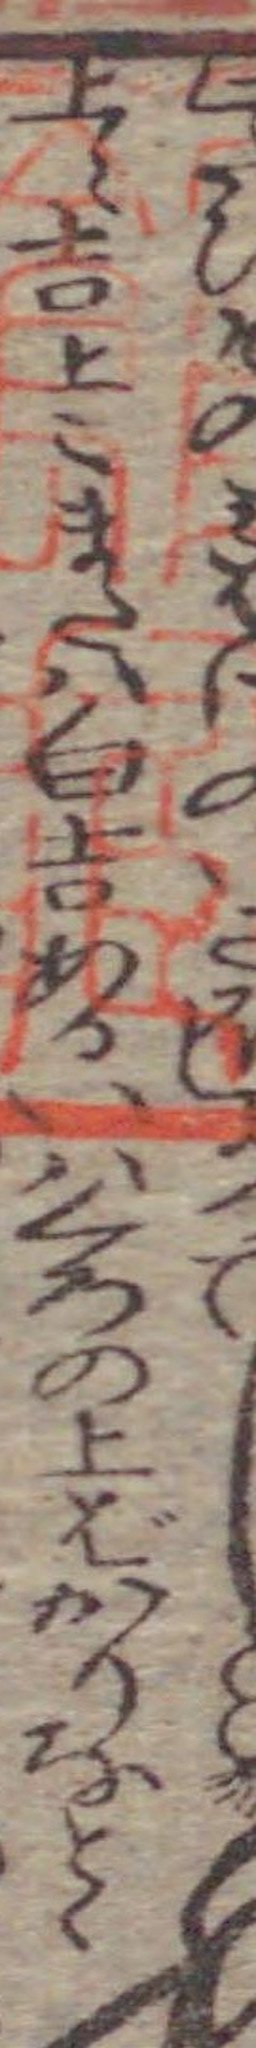上々吉上々または白吉あるいはくろの上ばかりなとゝ
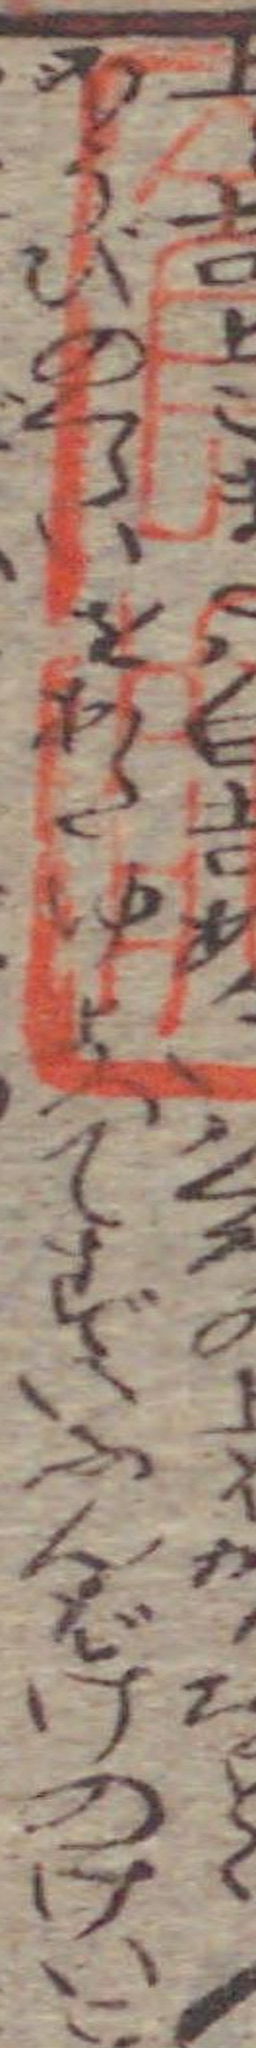ほうびのくらいをあたゆよつてずいふんばけのけいこ
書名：妖怪仕内評判記 : 2巻
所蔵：国立国会図書館 National Diet Library, JAPAN
